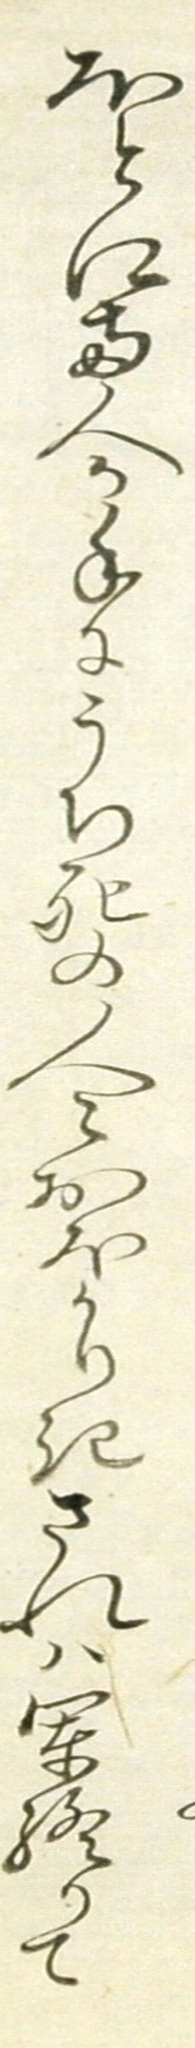ほとに両人か手にうち死の人々おほかりきされは軍終りて
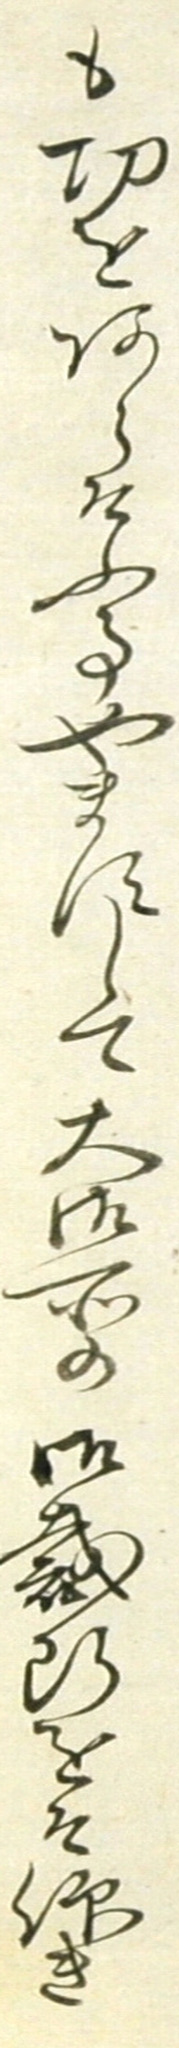も功をあらそふ事やますして大御所の御裁断をそ仰き
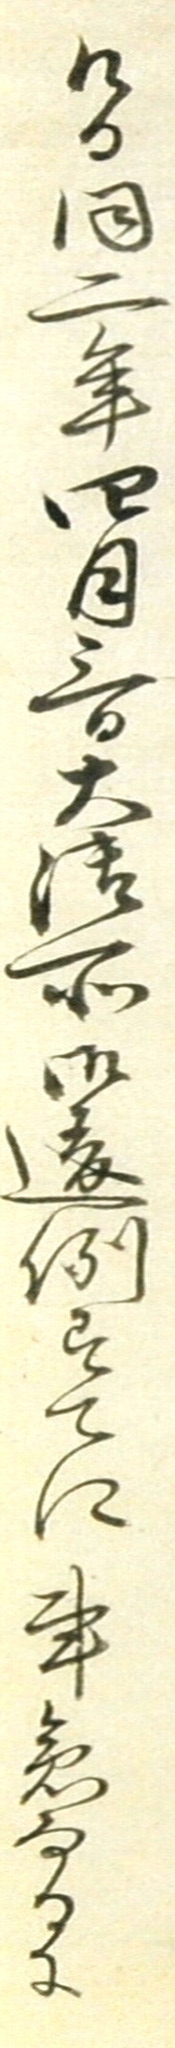ける同二年四月三日大御所御違例すてに事急なるに

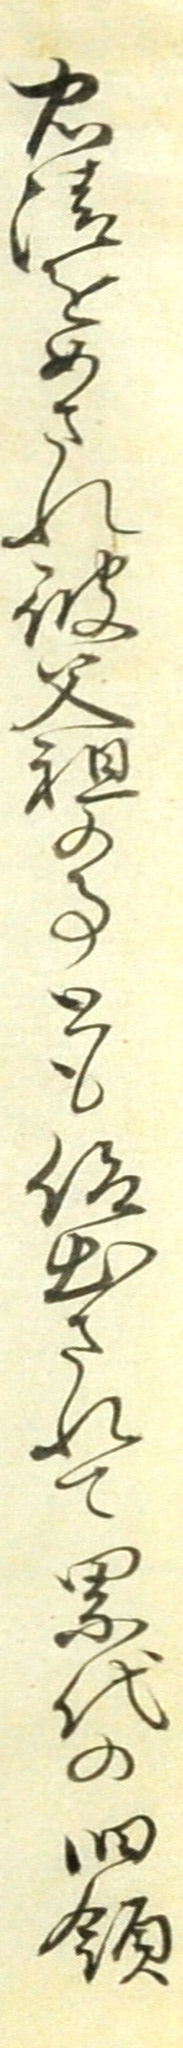忠清をめされ彼父祖の事とも仰出されて累代の旧領
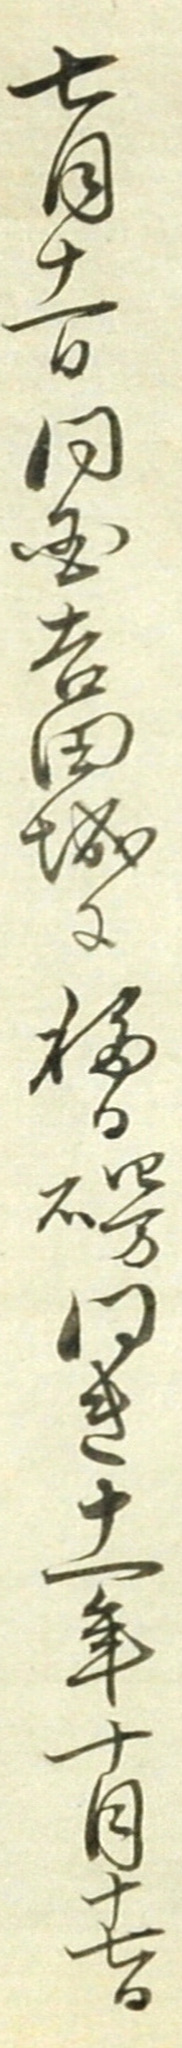七月十一日同国吉田城に移る四万石同き十一年十月十七日
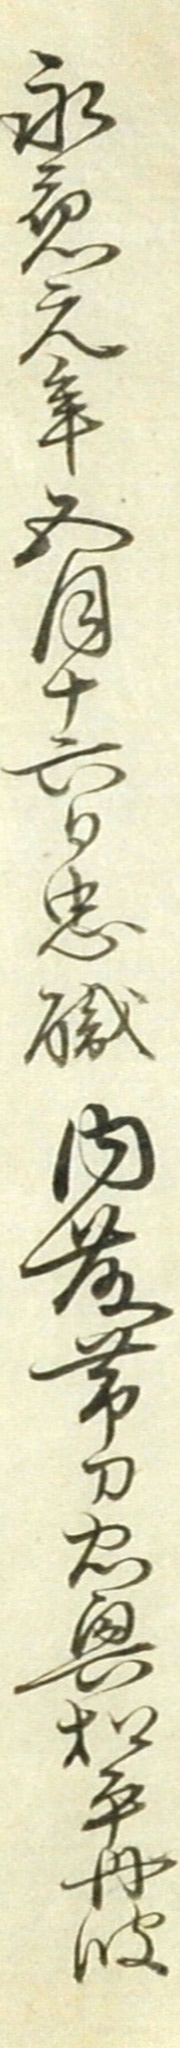永応元年五月十六日忠職内藤帯刀忠興松平丹波
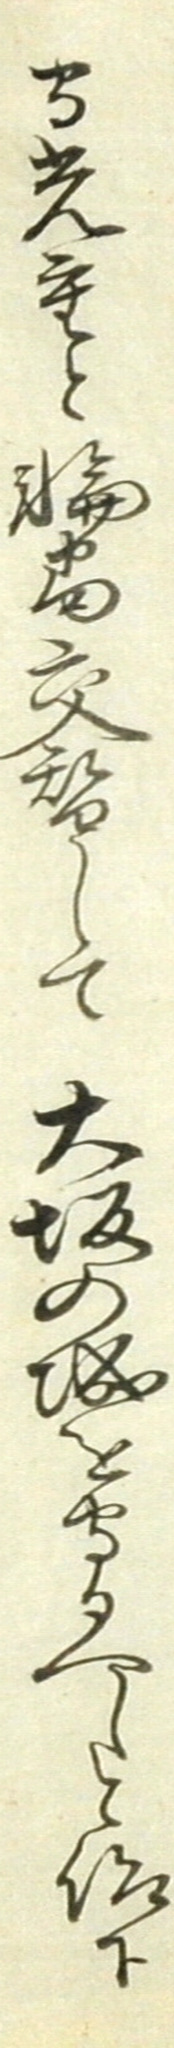守光重と輪番交替して大坂の城を守るへしと仰下
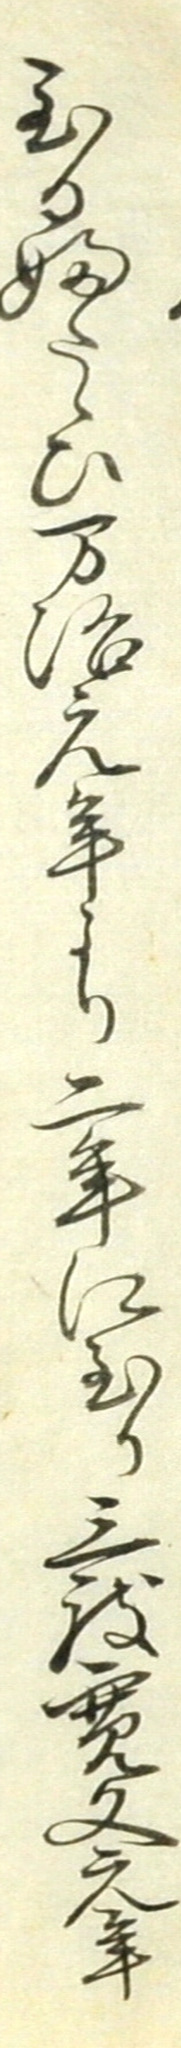至るふたゝひ万治元年より二年に至り三度寛文元年
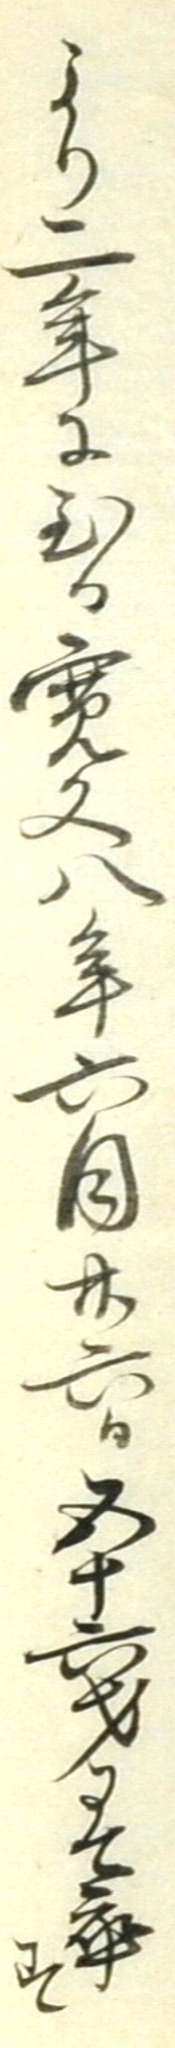より二年に至る寛文八年六月廿六日五十六才にて卒す
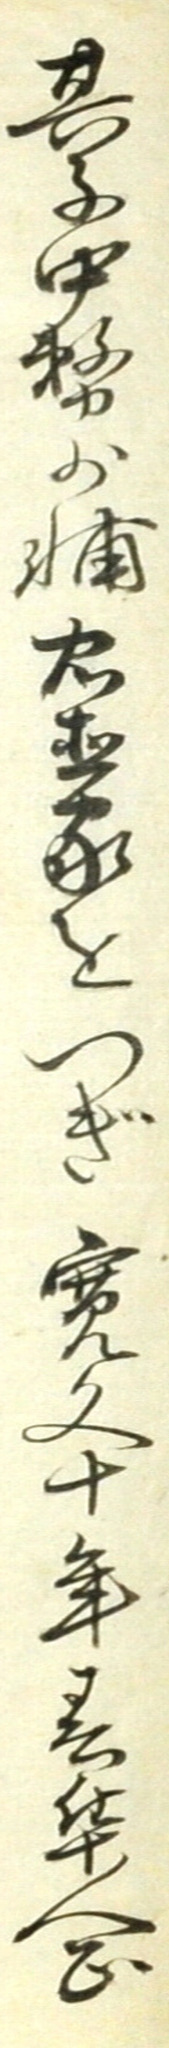其子中務少輔忠直家をつぎ寛文十年春隼人正
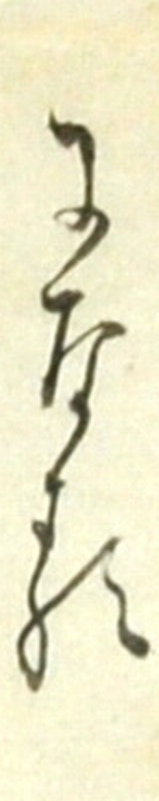になる
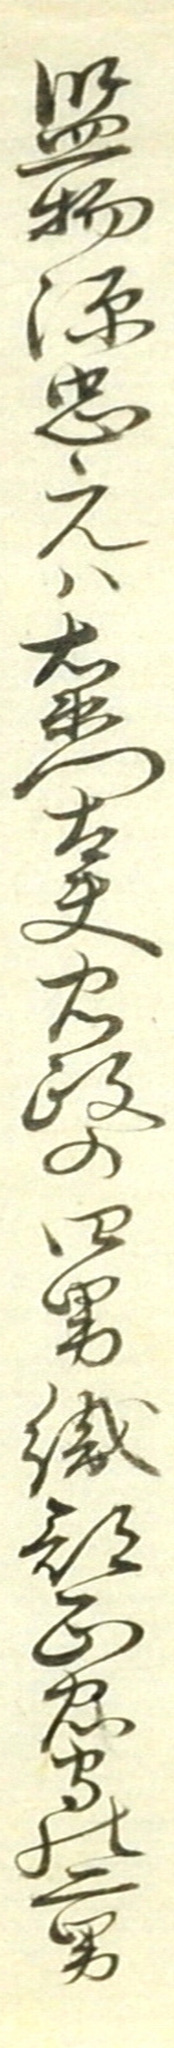監物源忠元は右衛門太夫忠政の四男織部正忠守の二男
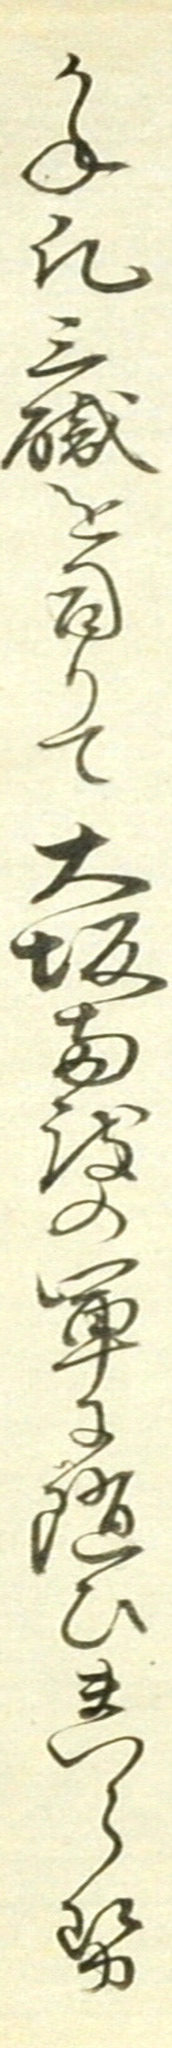かね凡三職を司りて大坂両度の軍に随ひまいらせ
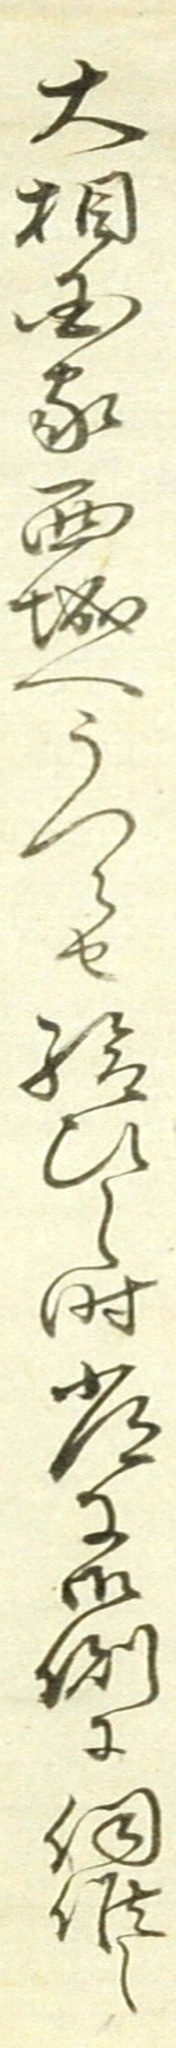大相国家西城へうつらせ給ひし時常に御側に伺候し
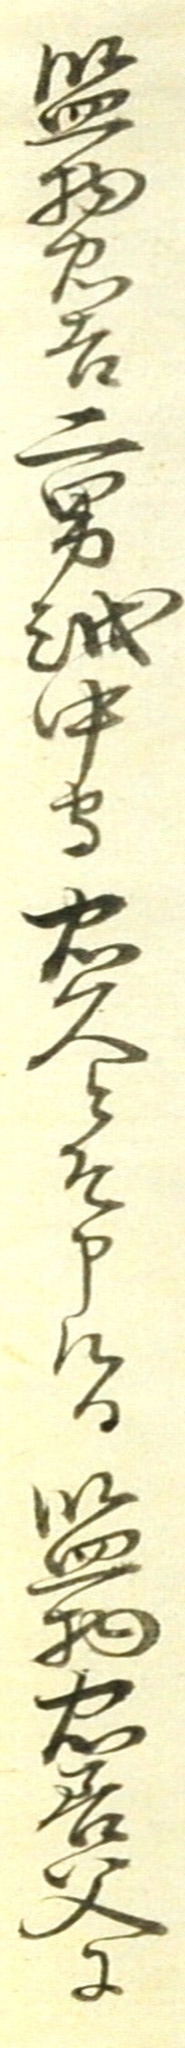監物忠吉二男越中守忠久とそ申ける監物忠善父に

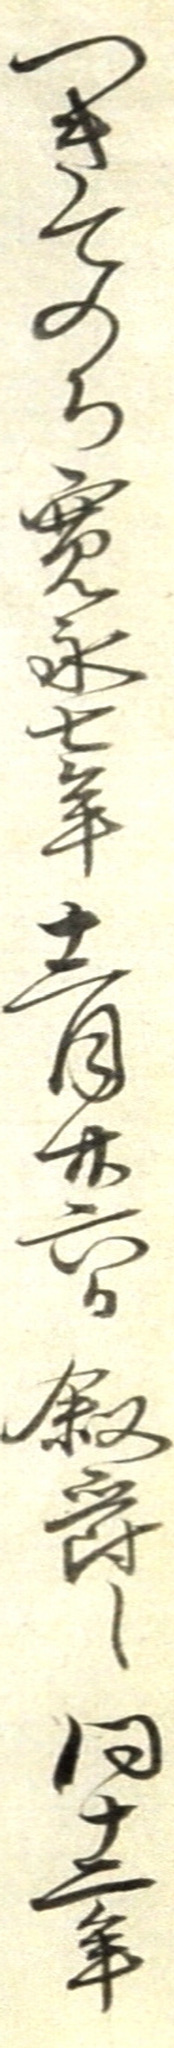つきてのち寛永七年十二月廿六日叙爵し同十二年
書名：藩翰譜（二・三）
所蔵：伊那市立高遠町図書館・合同会社AMANE
